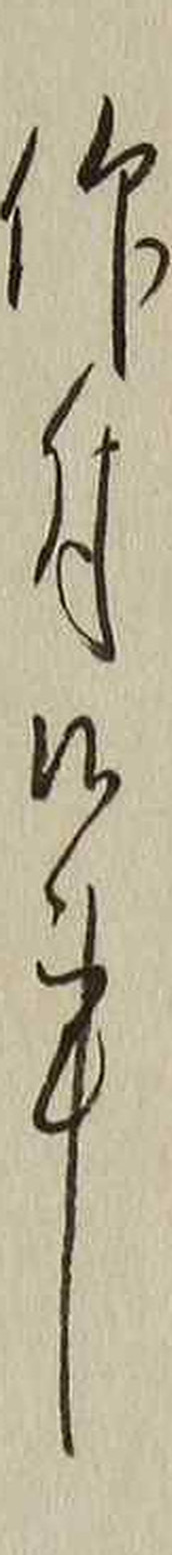仰付候事
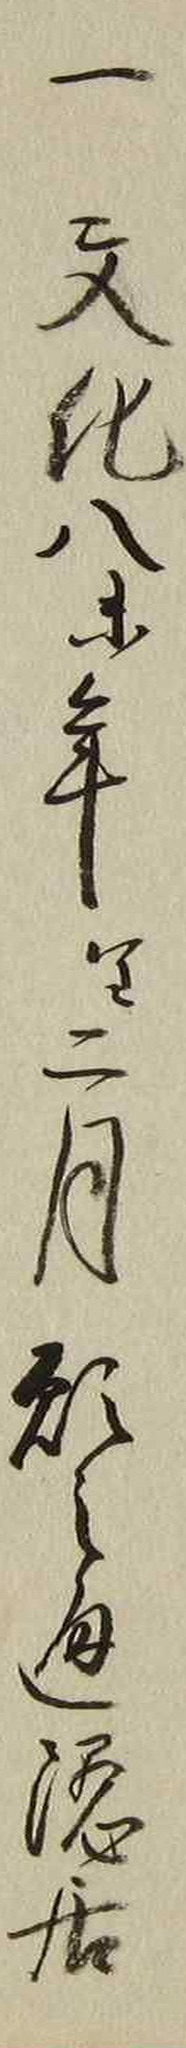一文化八未年閏二月願之通隠居
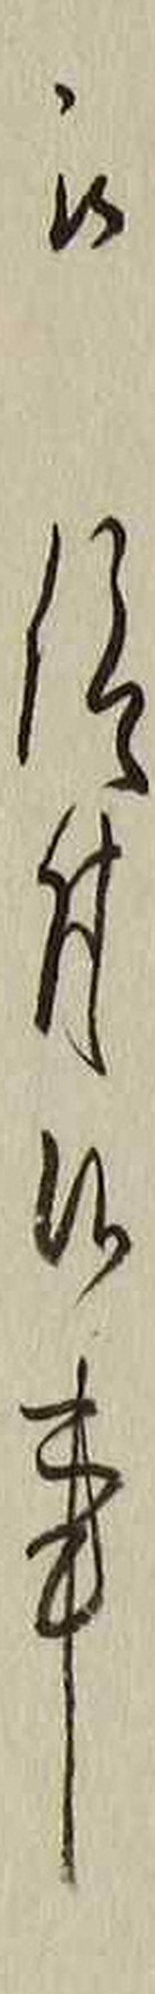被仰付候事
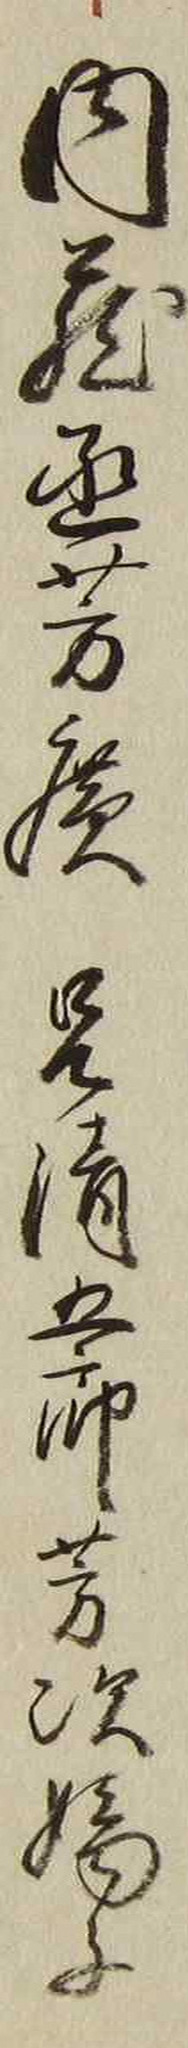内蔵丞芳広兄清五郎芳次嫡子
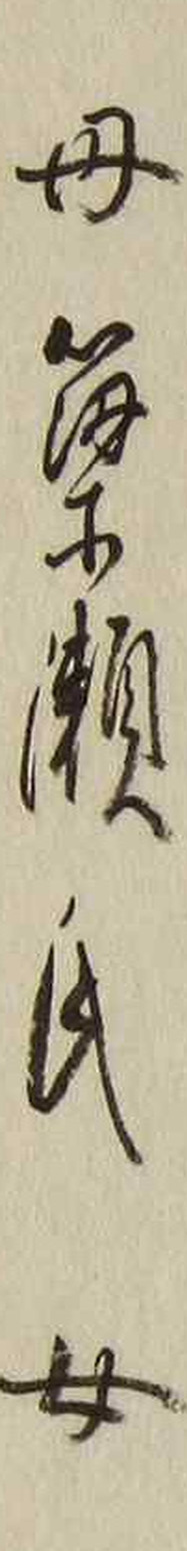母簗瀬氏女

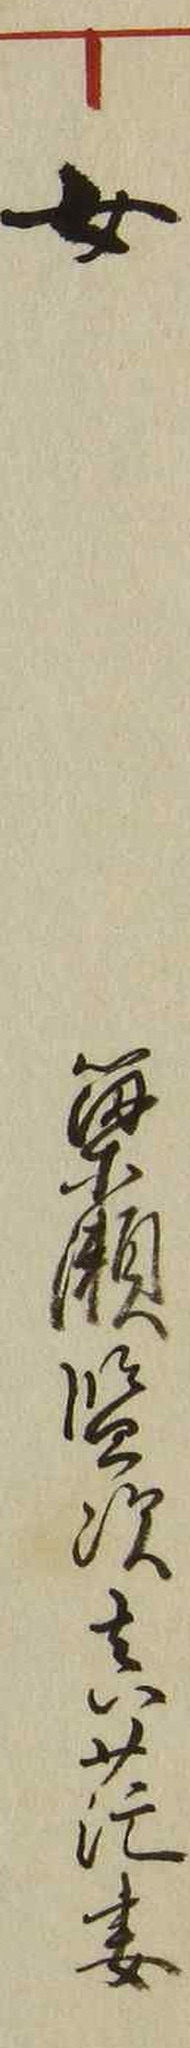女簗瀬監次真茫妻
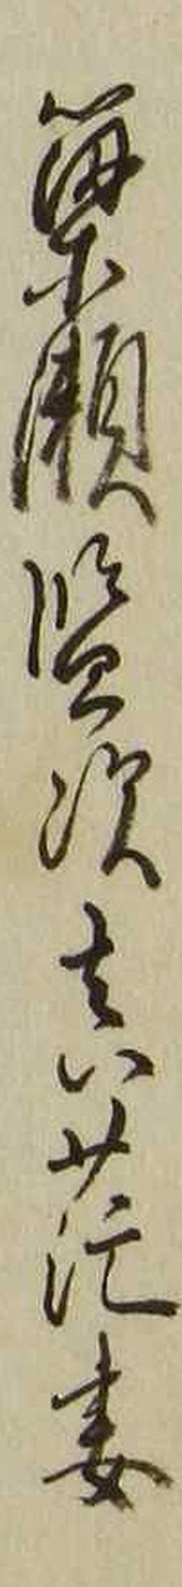女簗瀬監次真茫妻
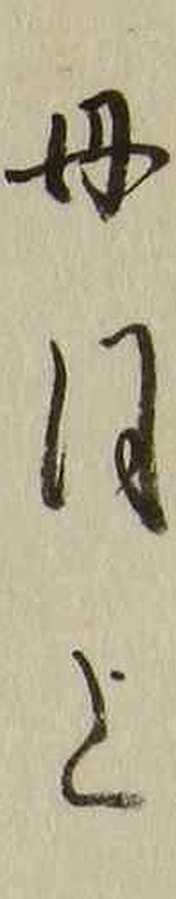母同上
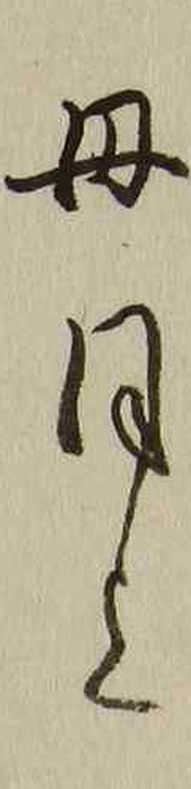母同上
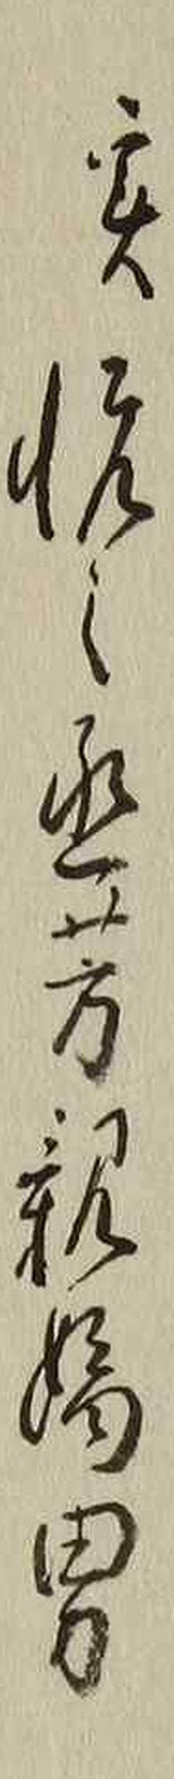実悦之丞芳親嫡男
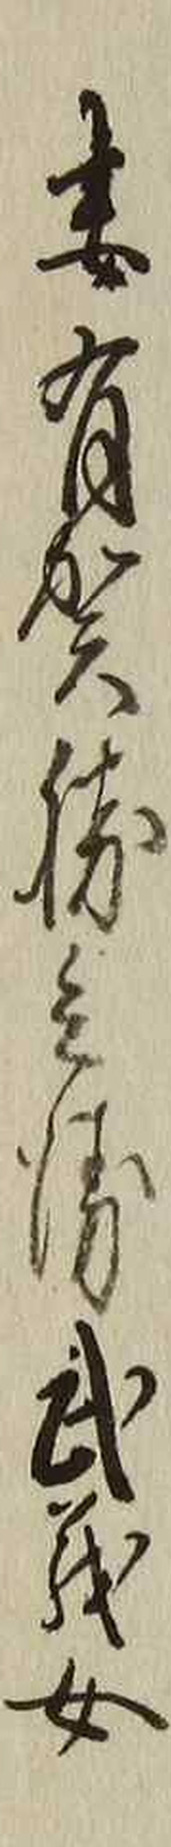妻有賀勝兵衛武義女
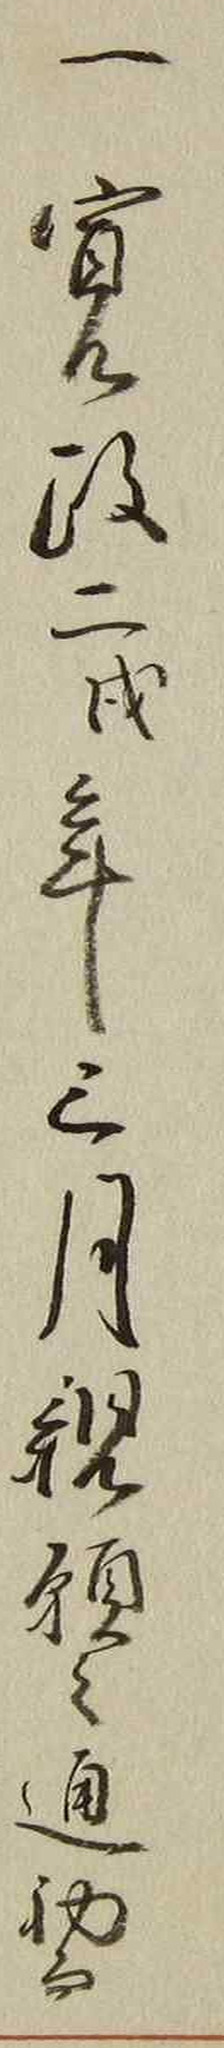一寛政二戌年三月親願之通初而
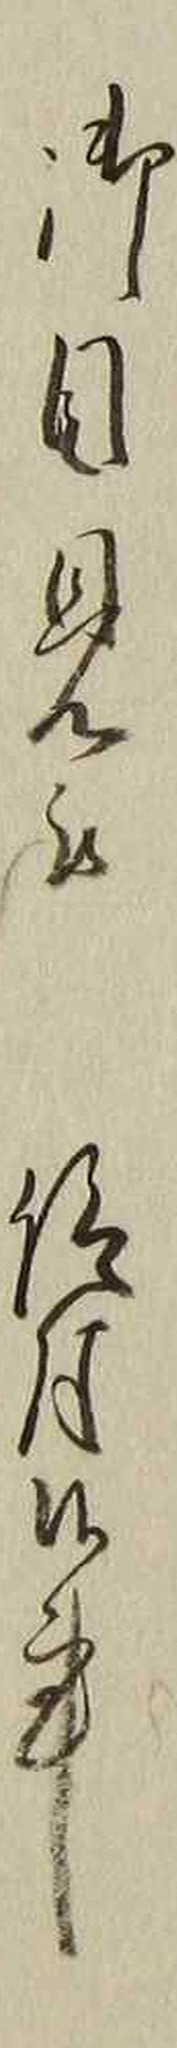之御目見被仰付候事
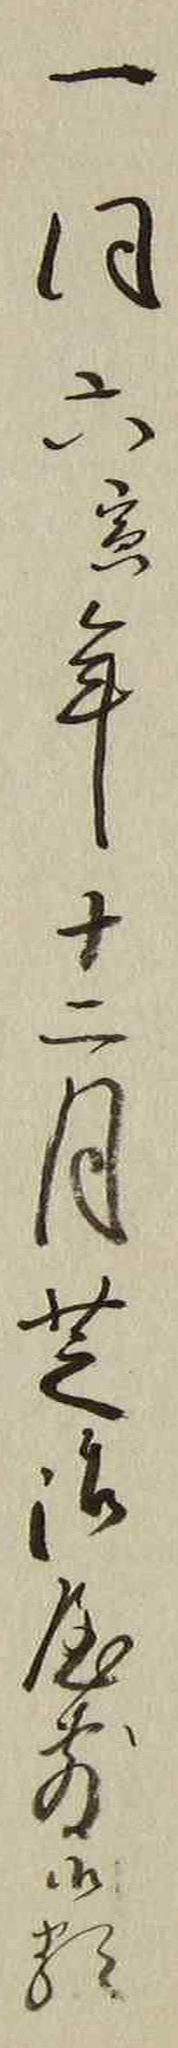一同六寅年十二月芝御屋敷御類
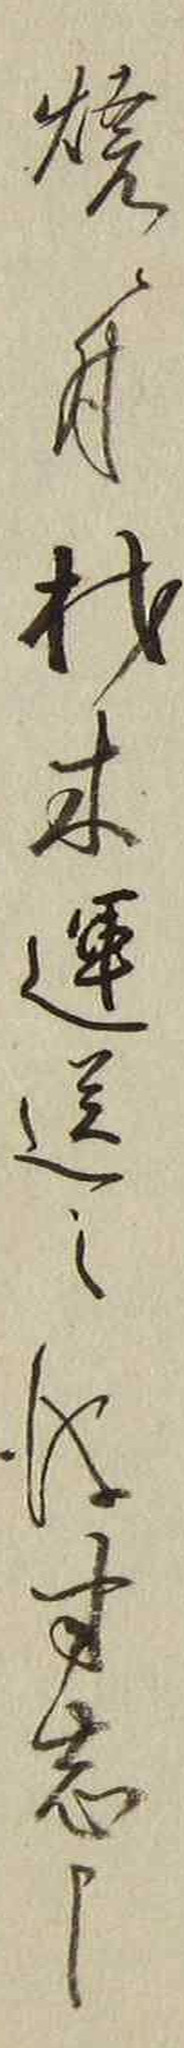焼ニ付材木運送之儀寸志申
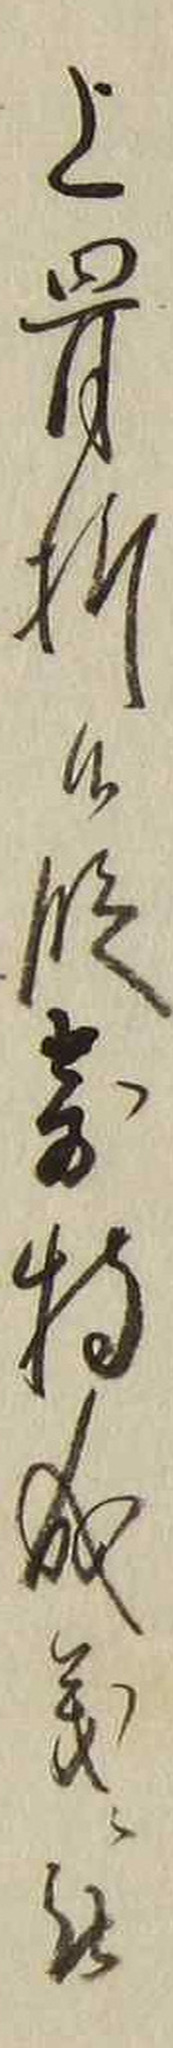上骨折候段奇特成義ニ被
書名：諸士系譜　巻之1　い之部1
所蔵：会津若松市立会津図書館
